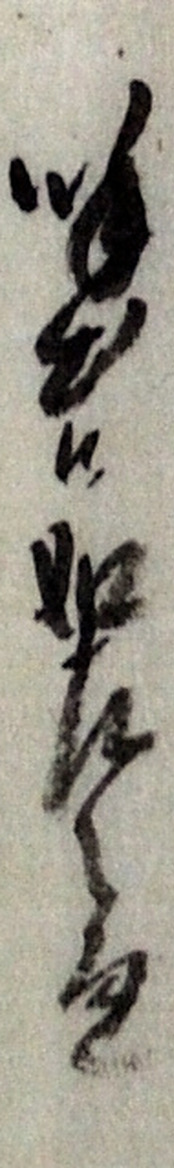呼出候処左之通

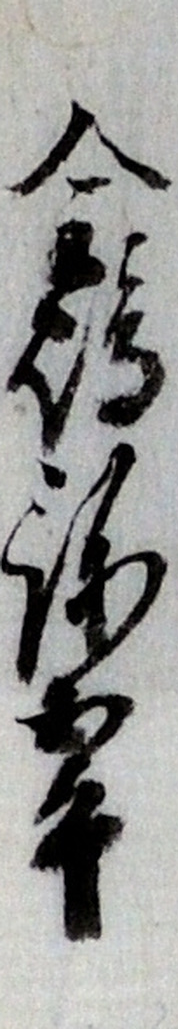金嶋弥五平
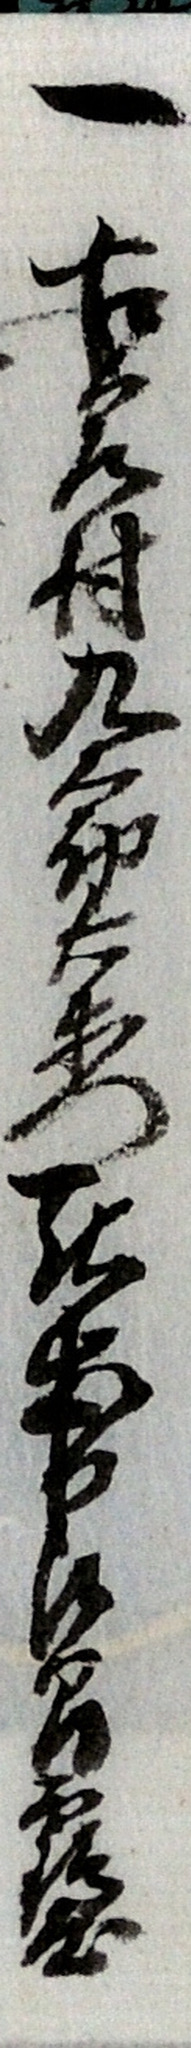一古見村九郎右衛門罷出申候間鶴屋
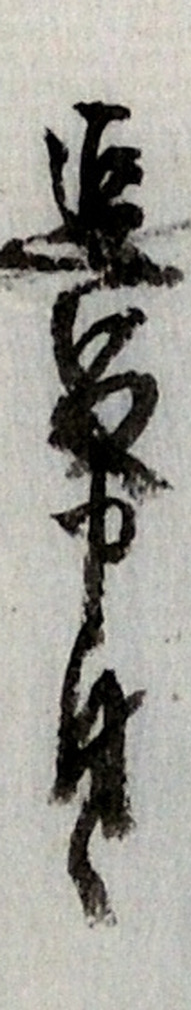逗留申付候
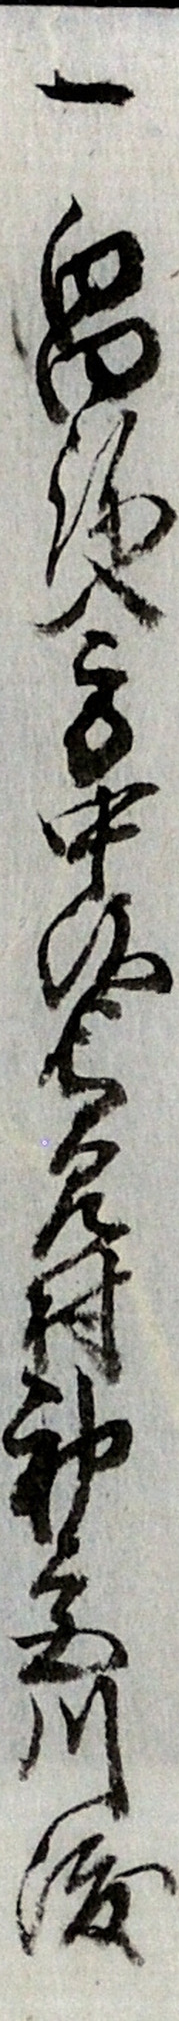一畠弥八方中沢高見村神宮川渡
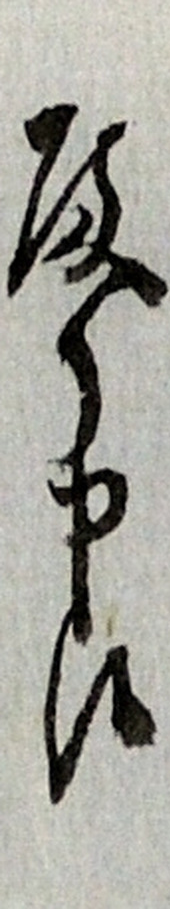帰り申候
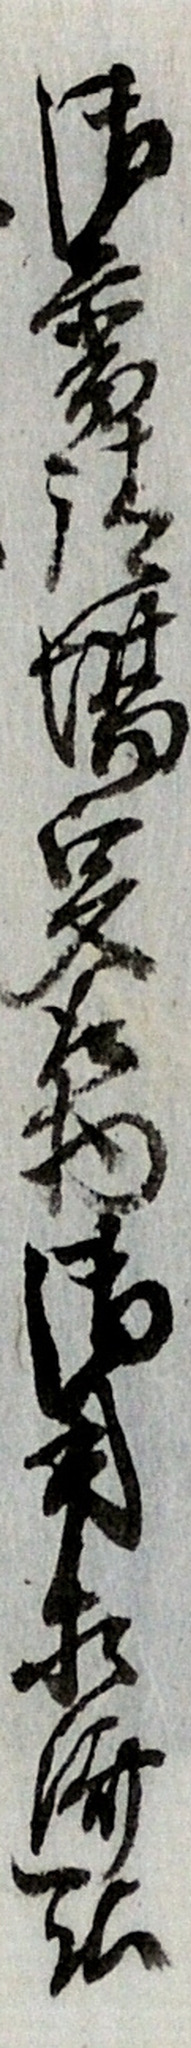御普請場受取物御用相済罷
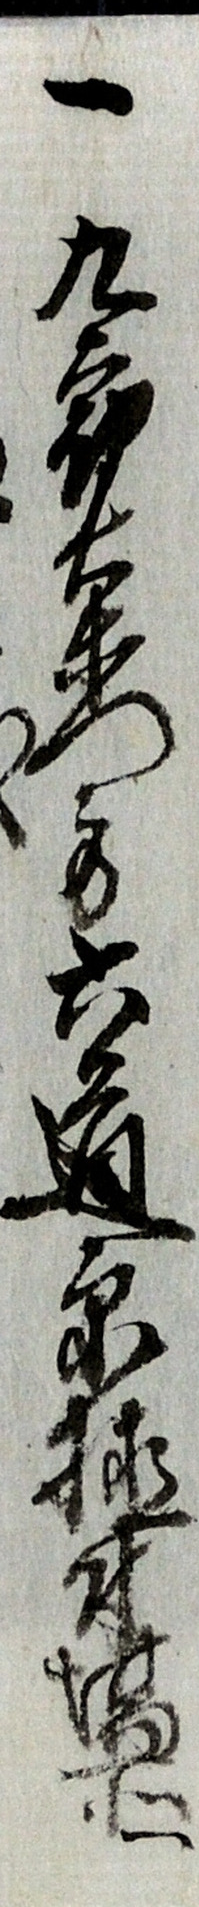一九郎右衛門方六道原植付場所へ
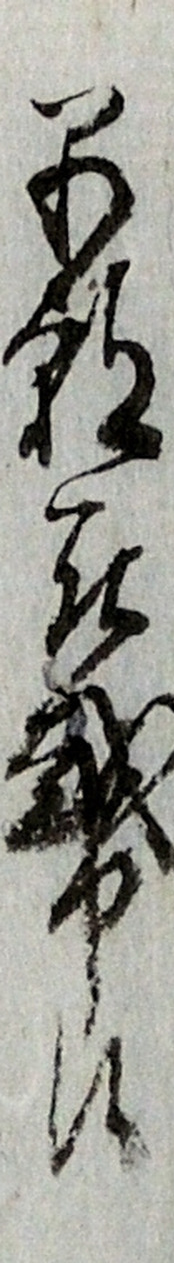早朝罷越申候
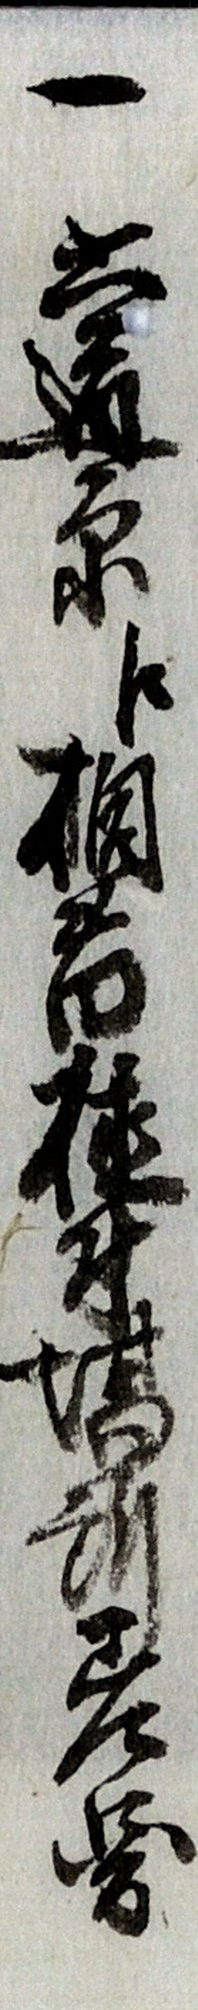一六道原江桐苗植付場所差図
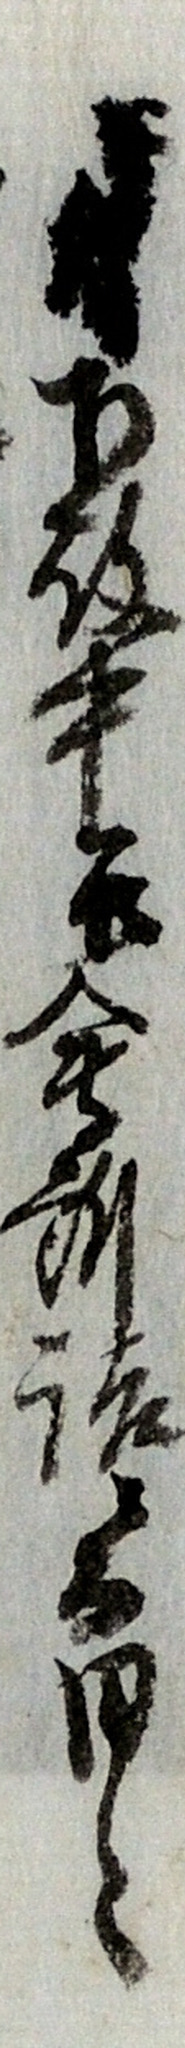ニ付下役中幷会所詰ニ而日々
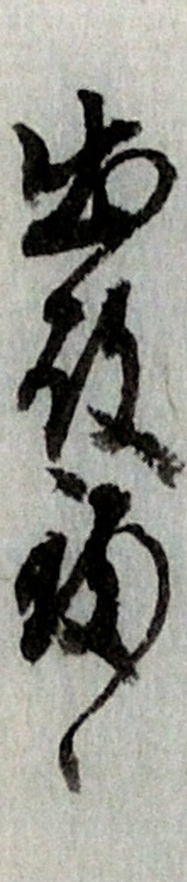出役致候
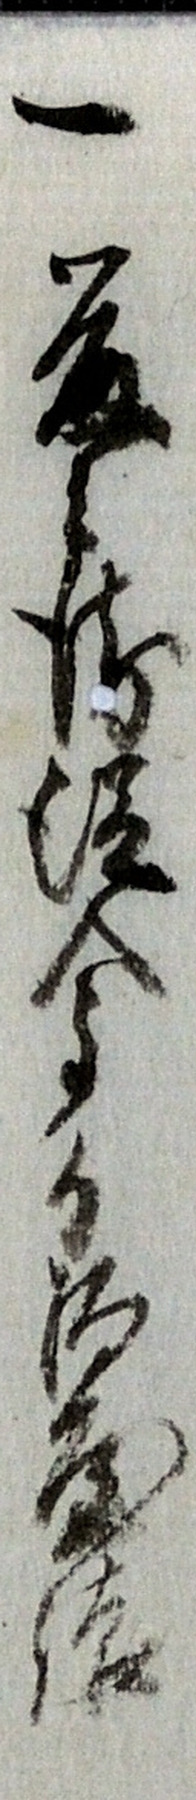一藤兵衛従今日酒屋詰
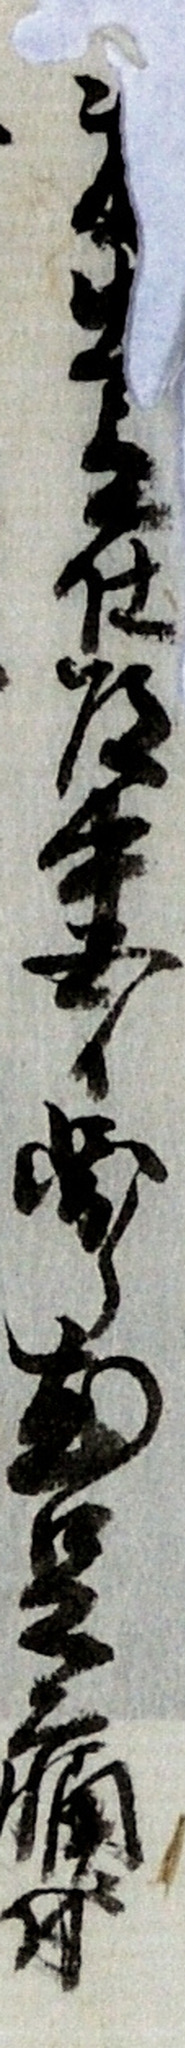敷出立仕道中五日図り尤足痛ニ付
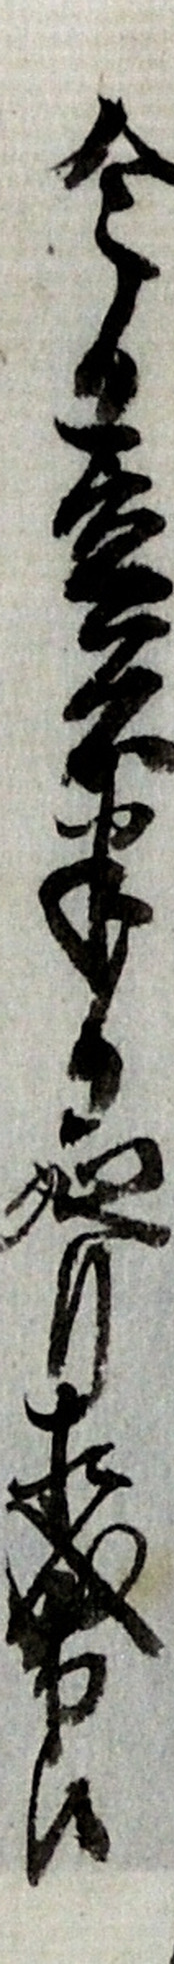今日昼前半日延引相成申候
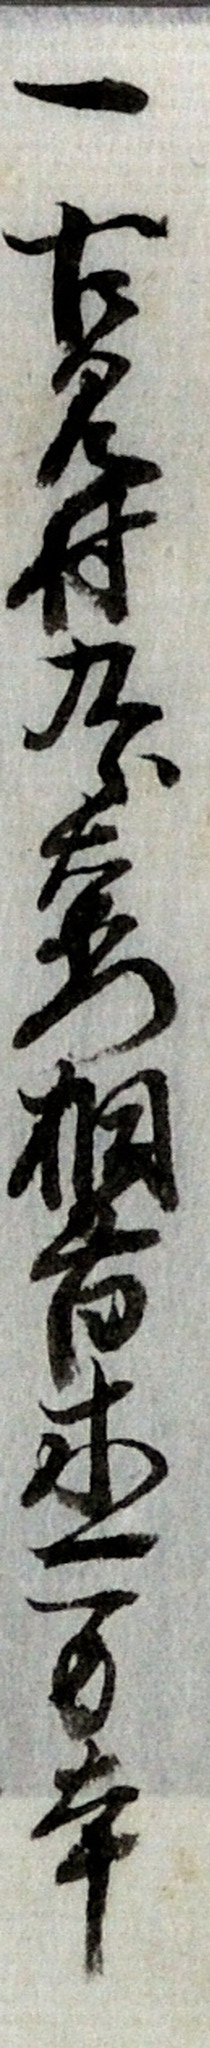一古見村九郎兵衛桐苗木一万本
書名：諸事御用留
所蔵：伊那市立高遠町図書館・合同会社AMANE
